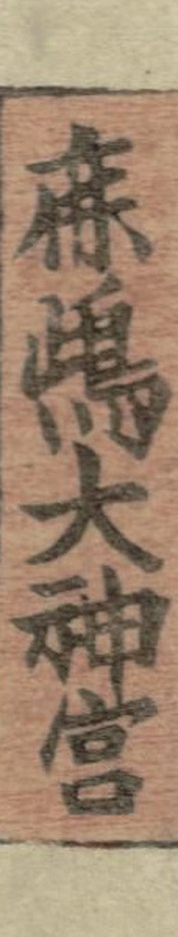鹿嶋の神の
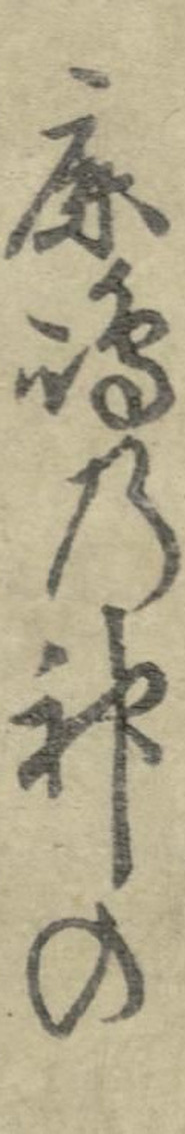鹿嶋の神の
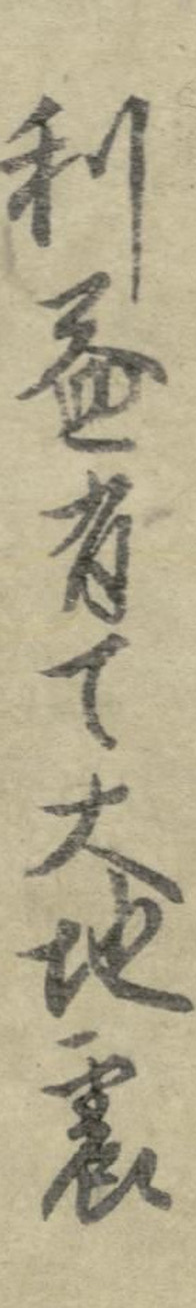利益有て大地震
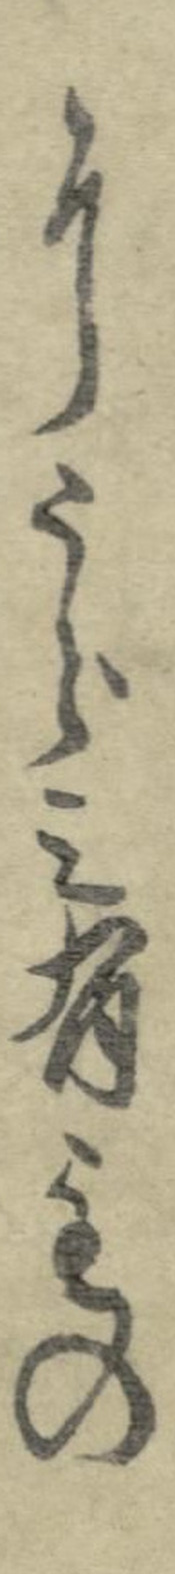にうらみ有主の
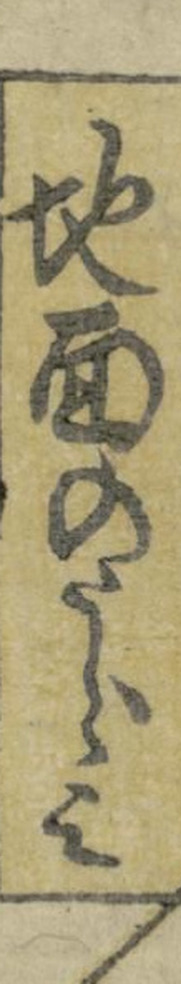地面のうらみ
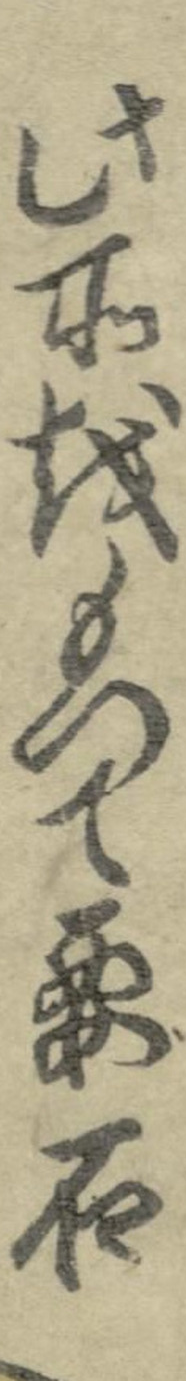此所をもつて要石
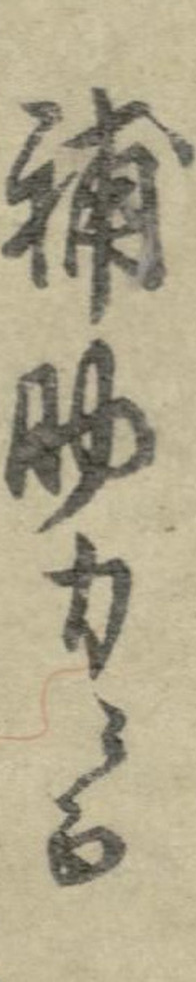補助力ニ而
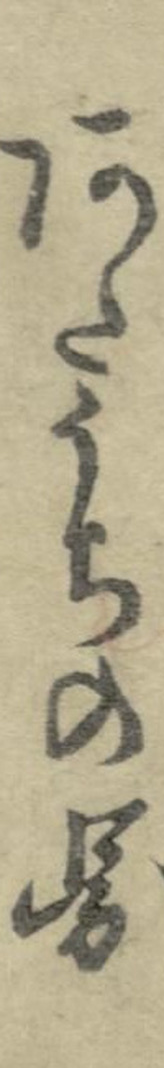あたうちの図
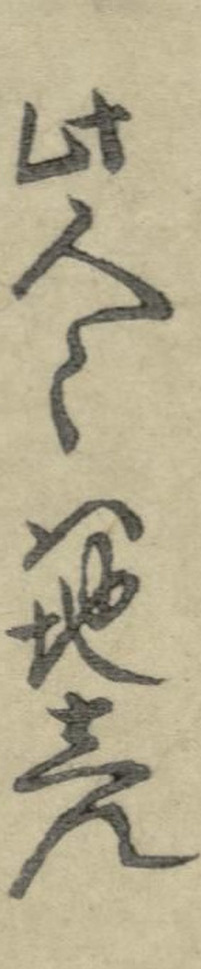此人々は地しん
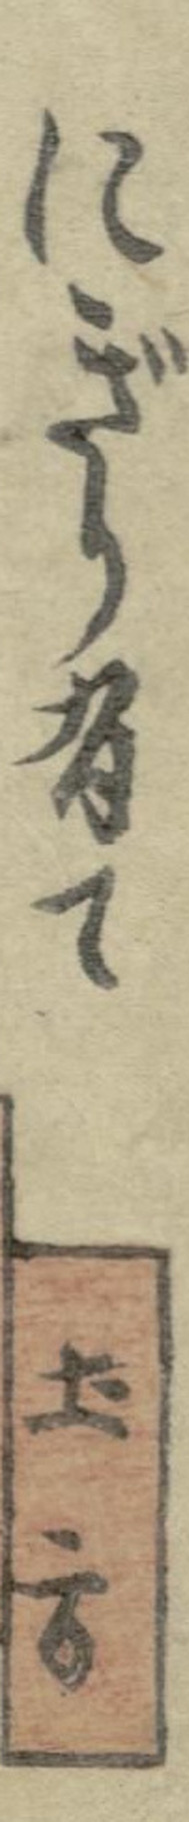にぎり有て
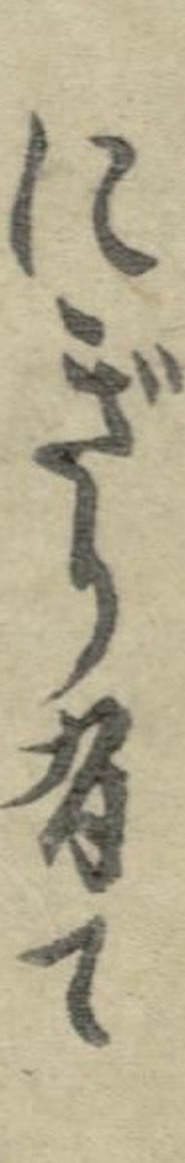にぎり有て
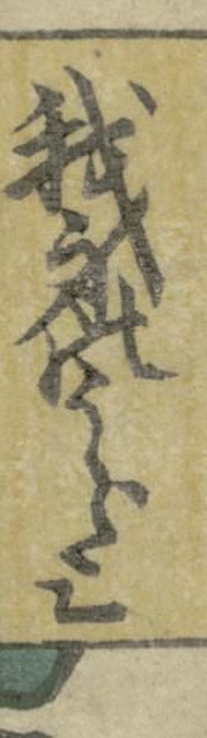子のうらみ
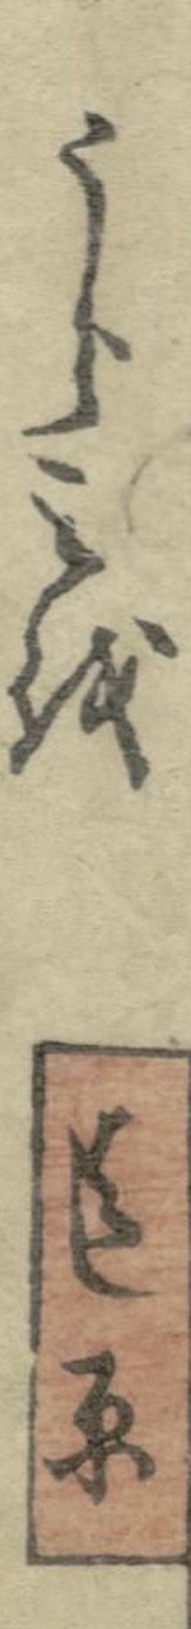うらみを
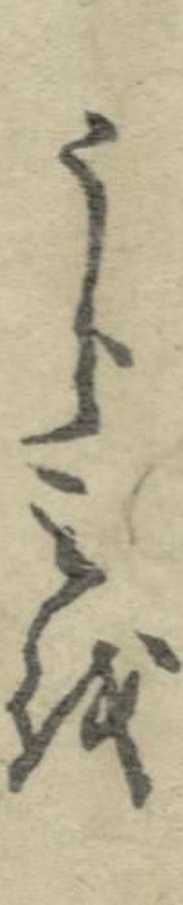うらみを
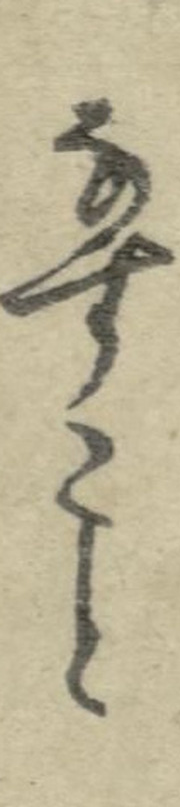なすこと
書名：[要石補助力に仇討ちの図]
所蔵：東京大学地震研究所図書室 Earthquake Research Institute Library, The University of Tokyo, JAPAN
